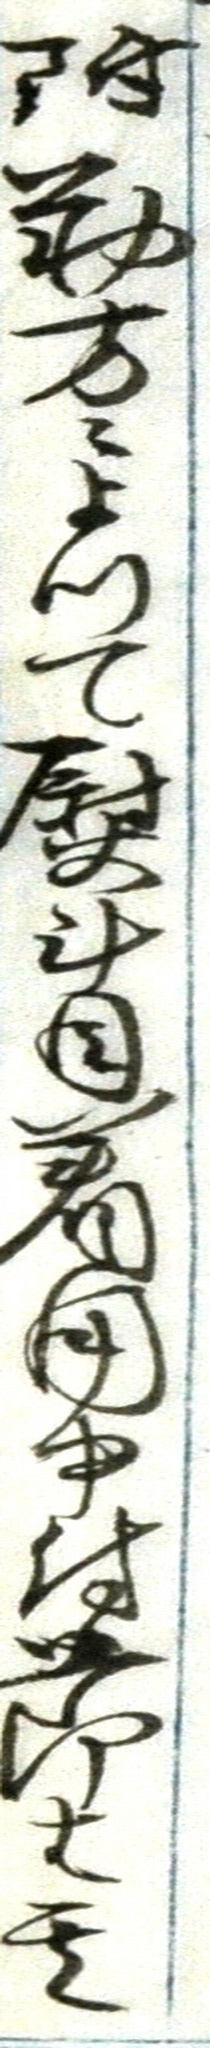附勤方ニよつて熨斗目着用申付節は其

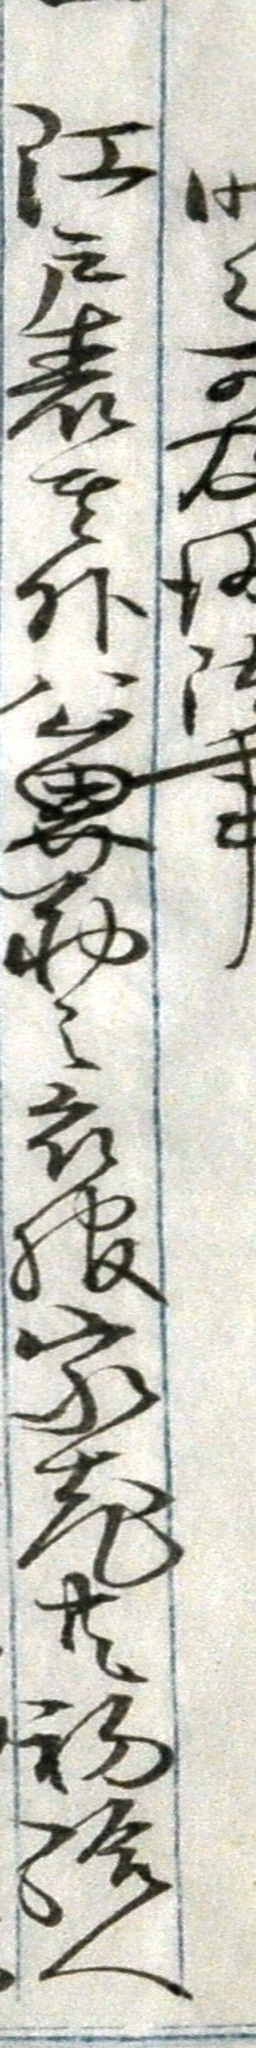一江戸表其外公界勤之衣服家老共初給人
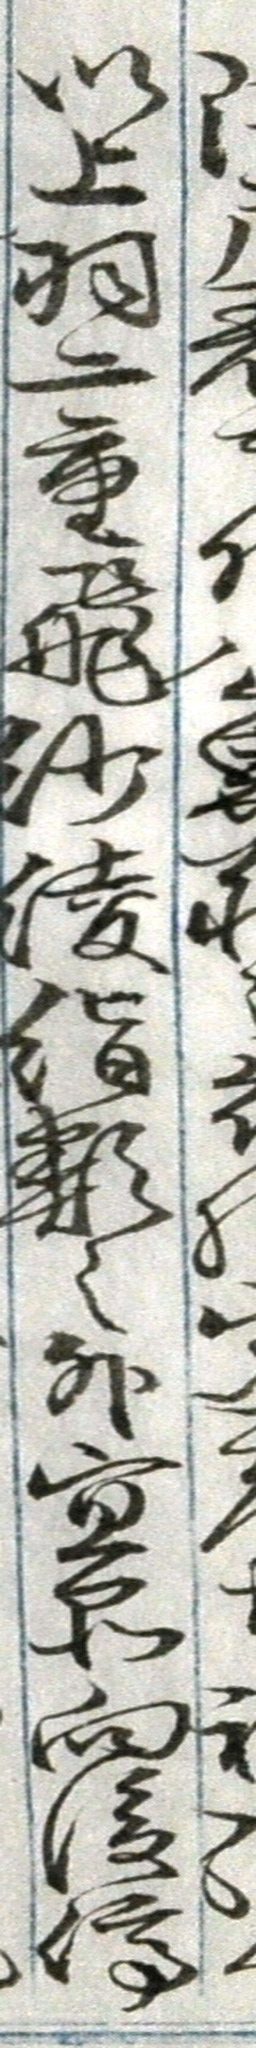以上羽二重飛紗綾絹類之外宜品向後停
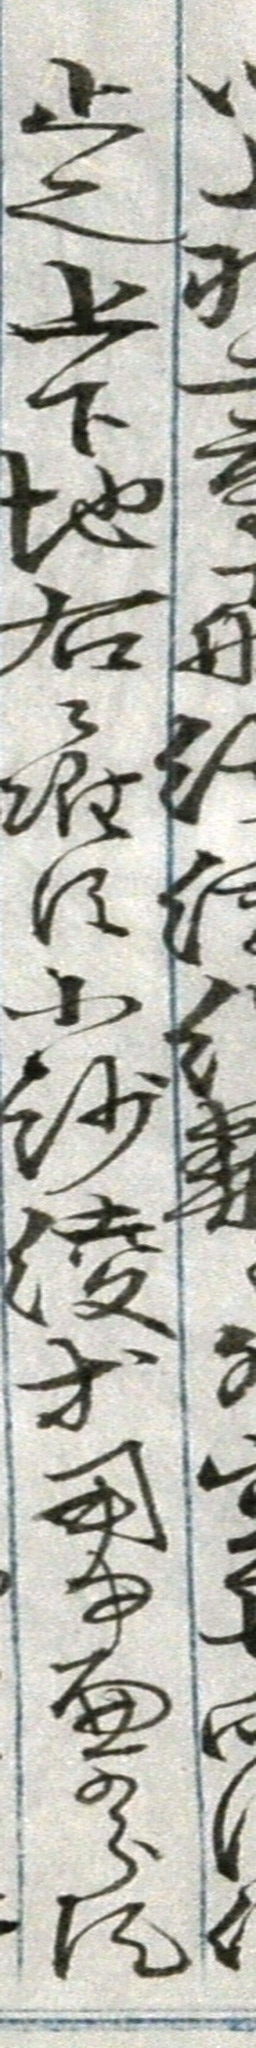止也上下地右ニ准す小紗綾等用ゆへからす
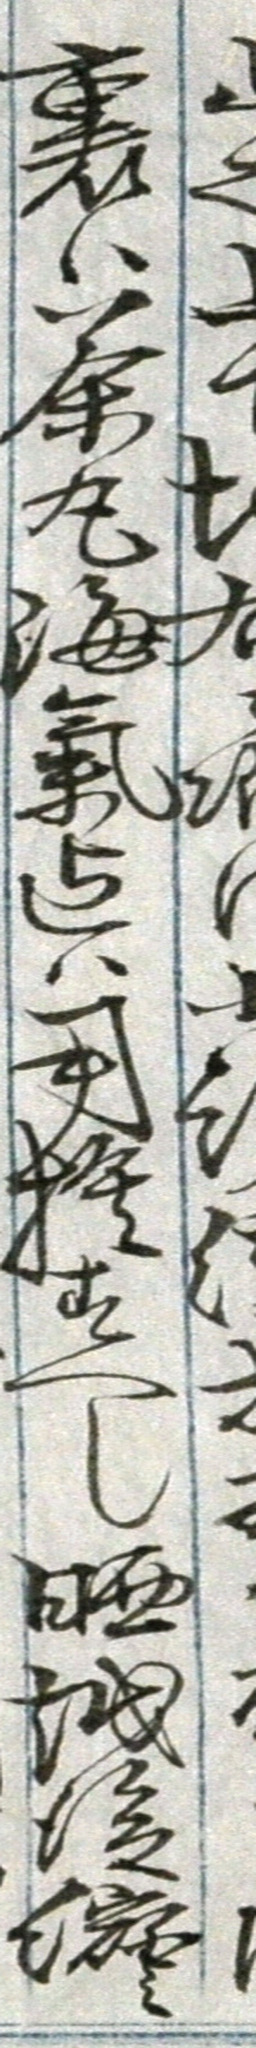裏ハ茶丸海気迄ハ用捨すへし晒越後縮之
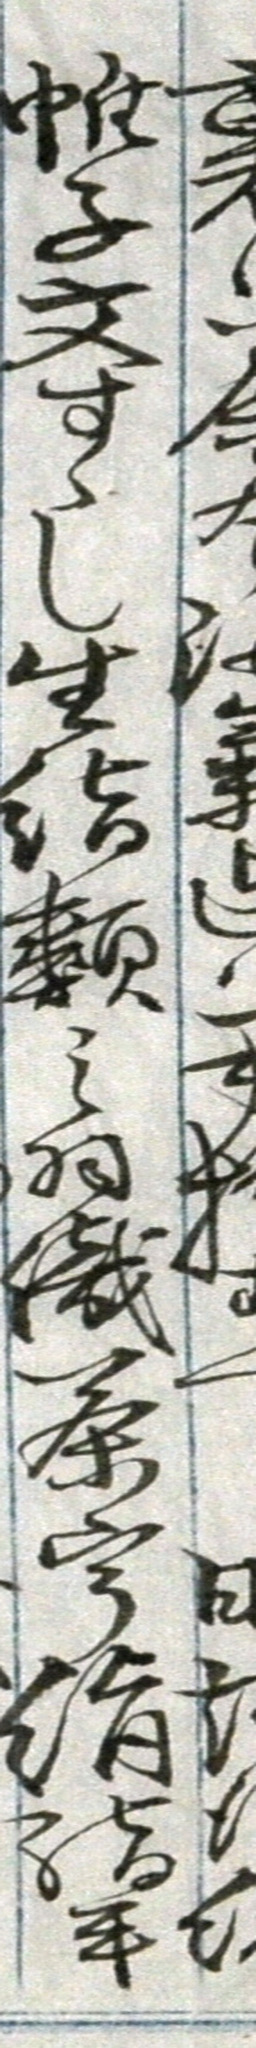帷子文すゝし生絹類之羽織茶宇絹絹平
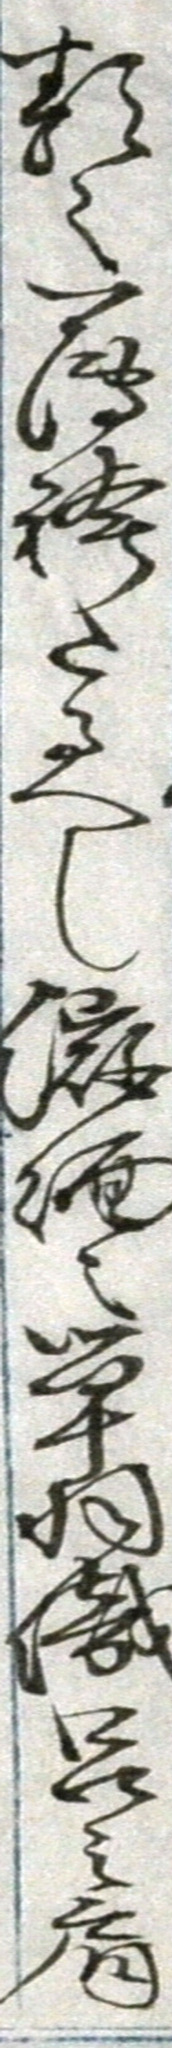類之薄袴たるへし縮緬之単羽織呂之肩
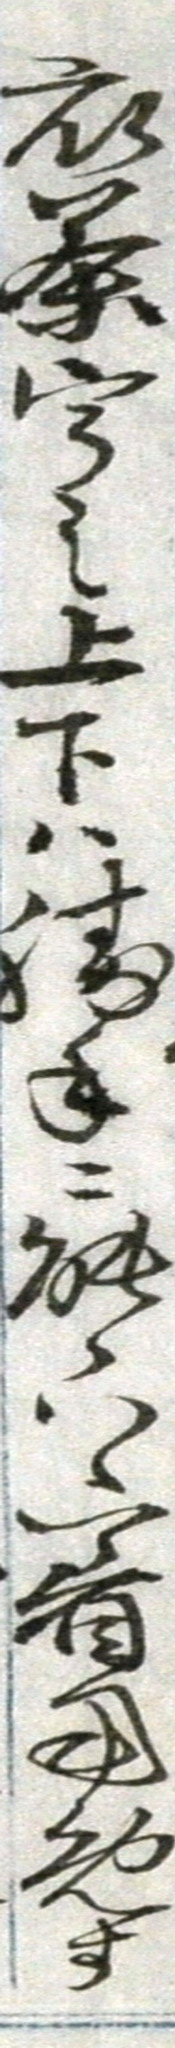衣茶宇之上下ハ勝手ニ能候ハヽ着用免す
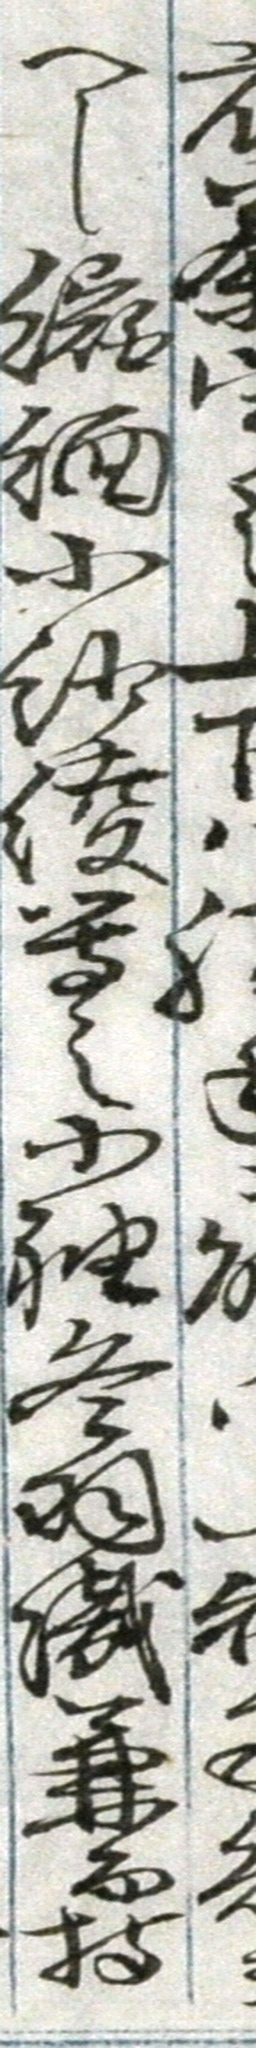へし縮緬小紗綾等之小袖冬羽織兼而持
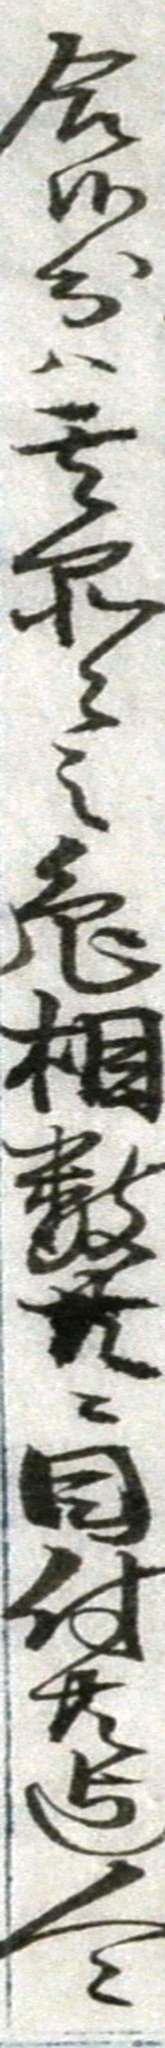合候分ハ其品々之色相数共ニ目付共迄人々
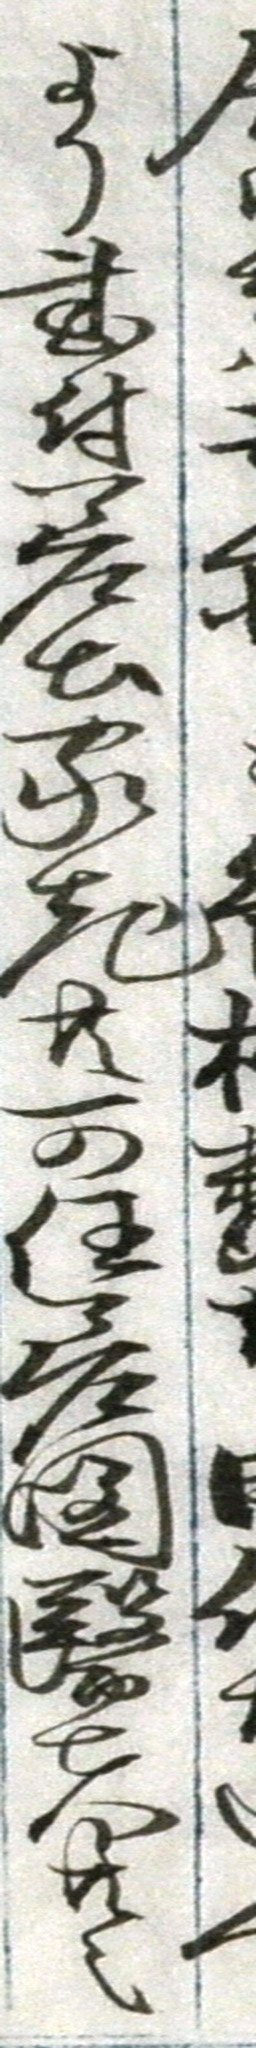より書付差出家老共可任差図医者共之
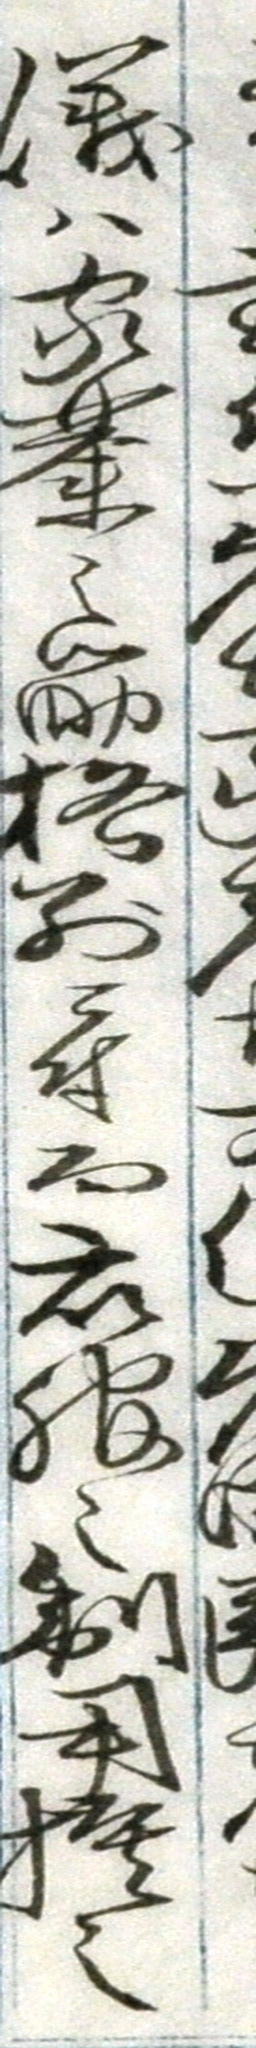儀ハ家業之筋格別ニ付而衣服之制用捨之
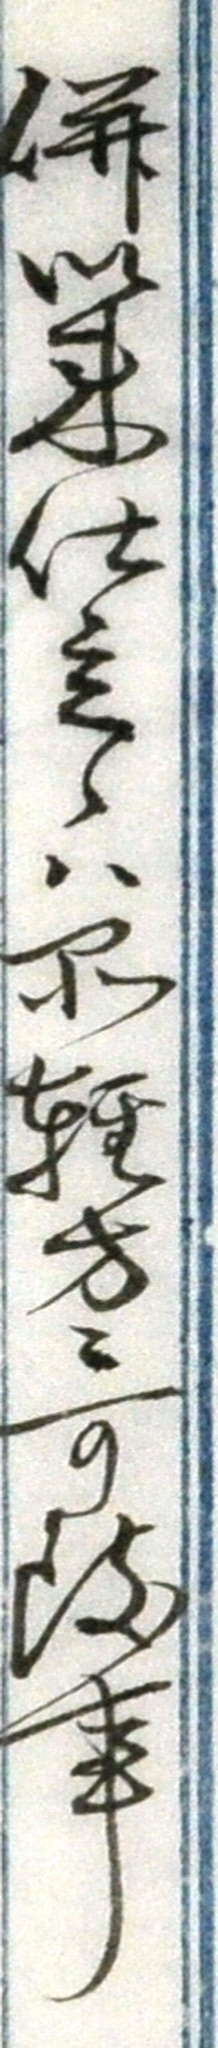併以来仕立候ハ︎品軽方ニ可致事
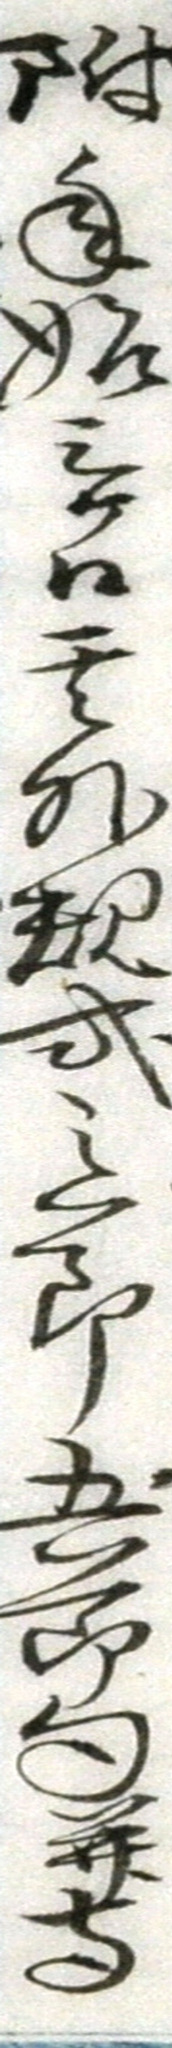附年始三ケ日其外規式之節五節句并寺
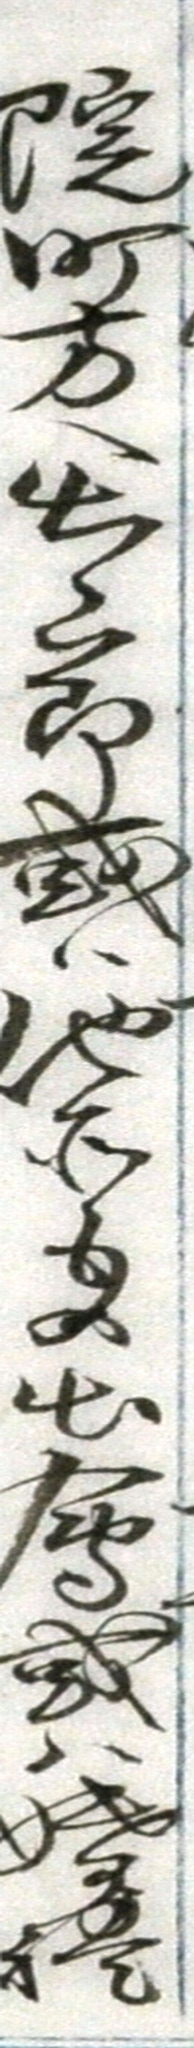院町方へ出候節或ハ他所もの出会或ハ婚礼
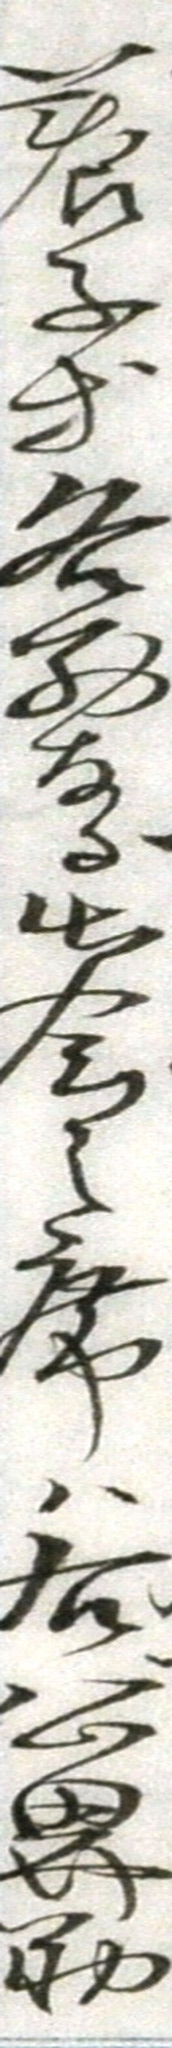養子等各別なる出会之席ハ右公界勤
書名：頼由公（源隆院殿）御定
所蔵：伊那市立高遠町図書館・合同会社AMANE
